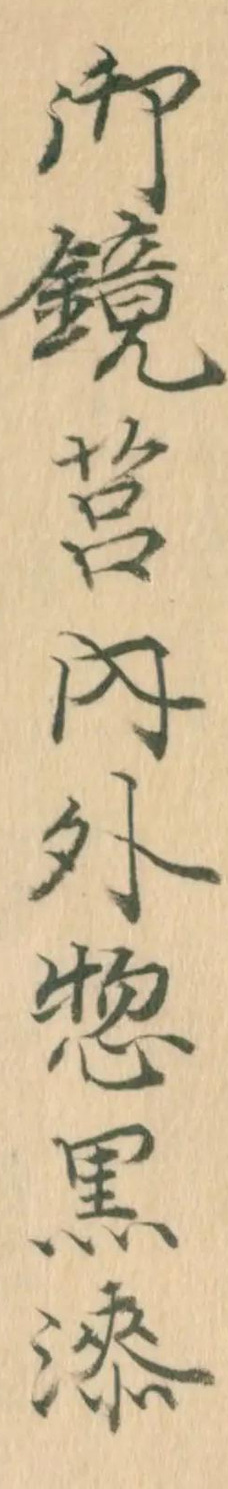御鏡筥内外惣黒漆
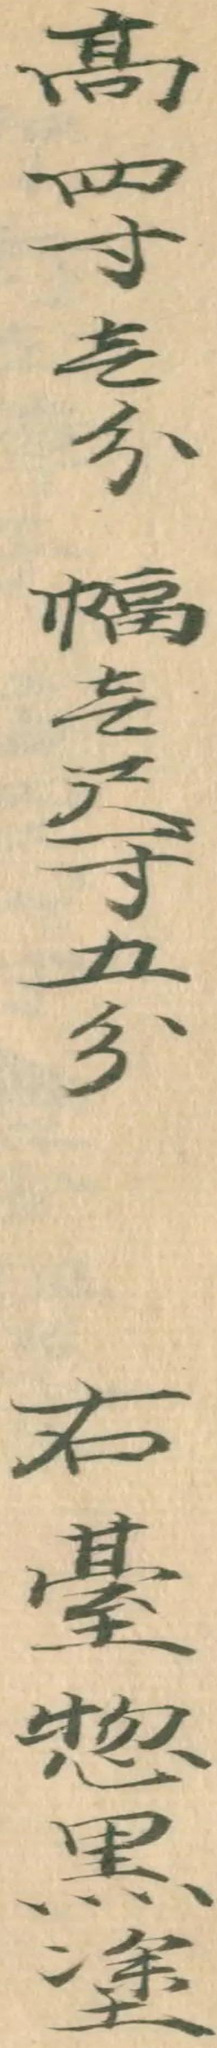高四寸壱分幅壱尺一寸五分右台惣黒漆
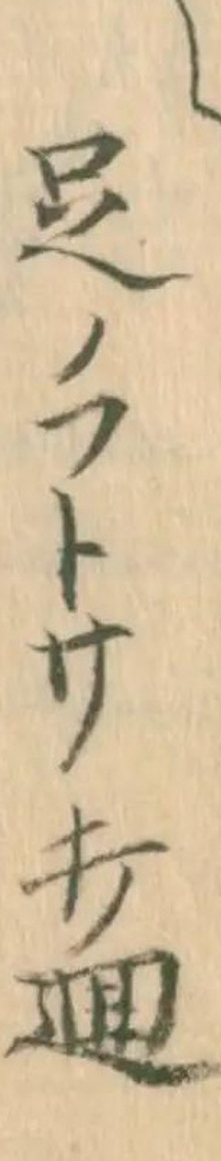足ノフトサ打廻
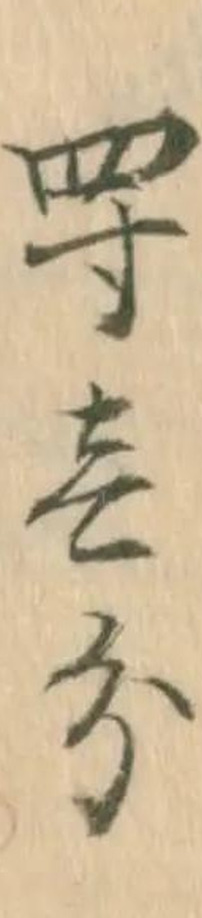四寸壱分
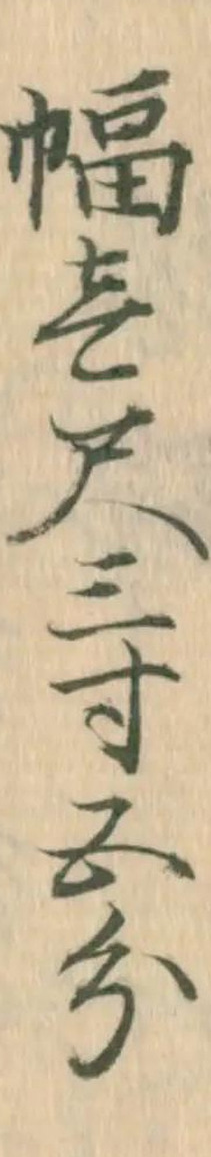横幅壱尺六寸五分
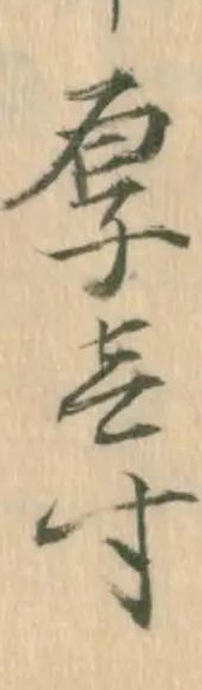厚壱寸
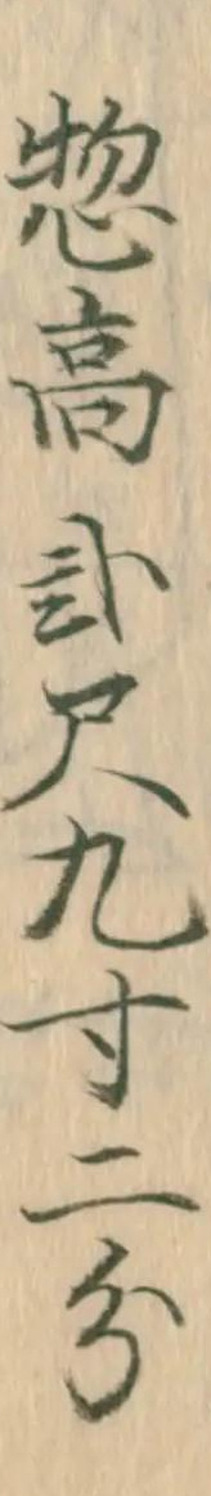惣高弐尺九寸二分
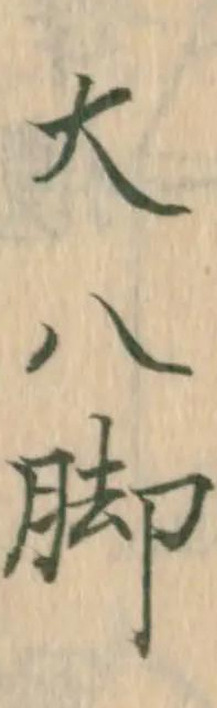大八脚
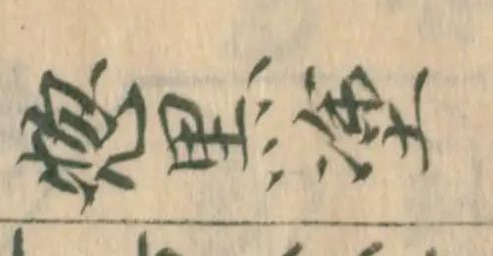惣黒漆

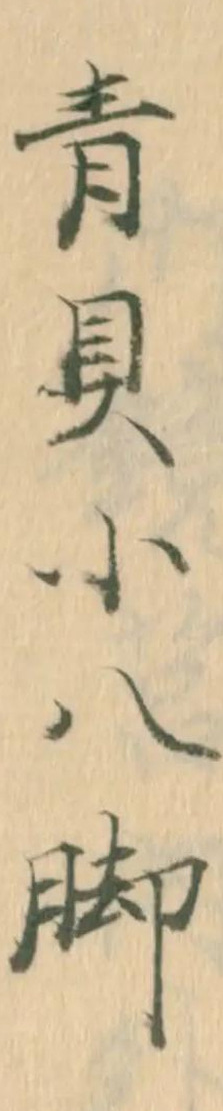青貝小八脚
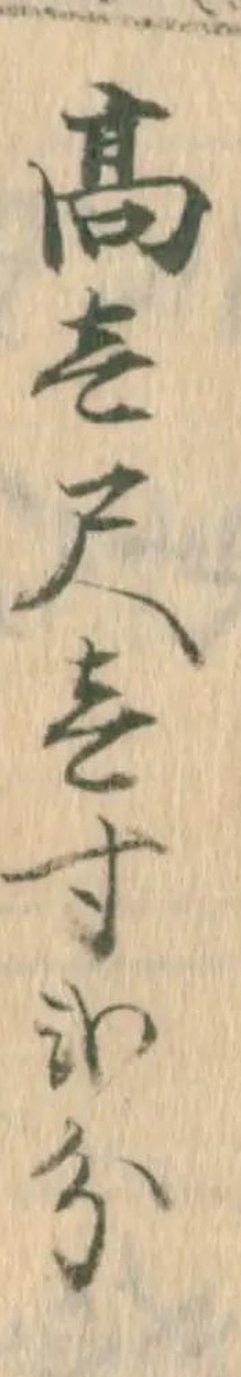高壱尺壱寸弐分
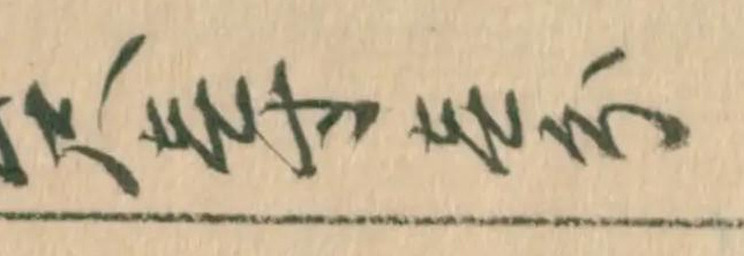長弐尺壱寸壱分
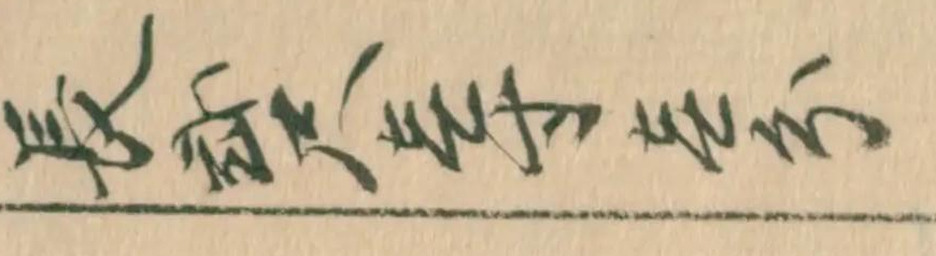長弐尺壱寸壱分
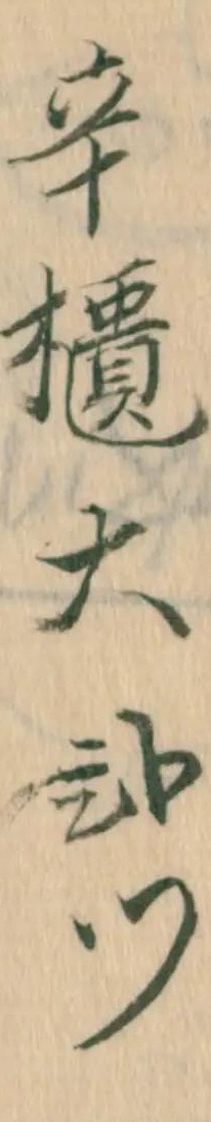辛櫃大弐ツ
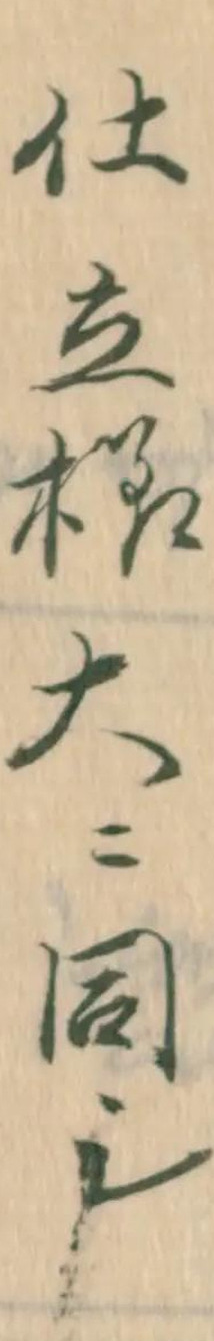仕立様大ニ同シ
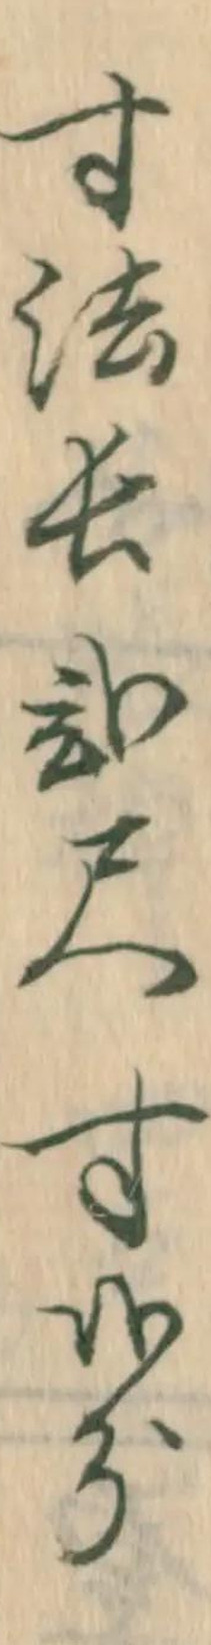寸法長弐尺寸弐分
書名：賀茂社記録. 第15冊
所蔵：国立国会図書館 National Diet Library, JAPAN
